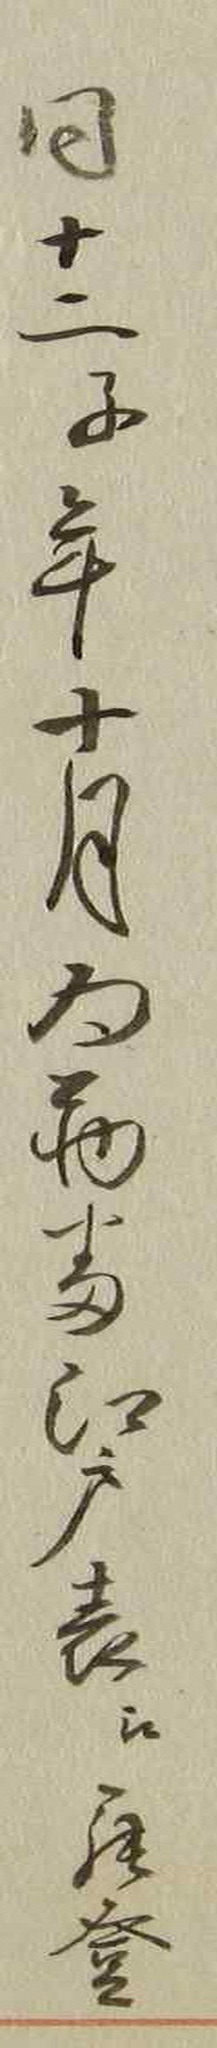一同十二子年十月為勤番江戸表江罷登
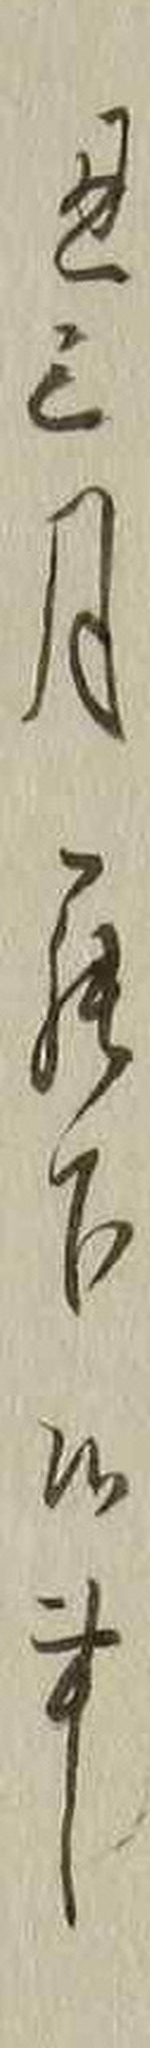同三月罷下候事
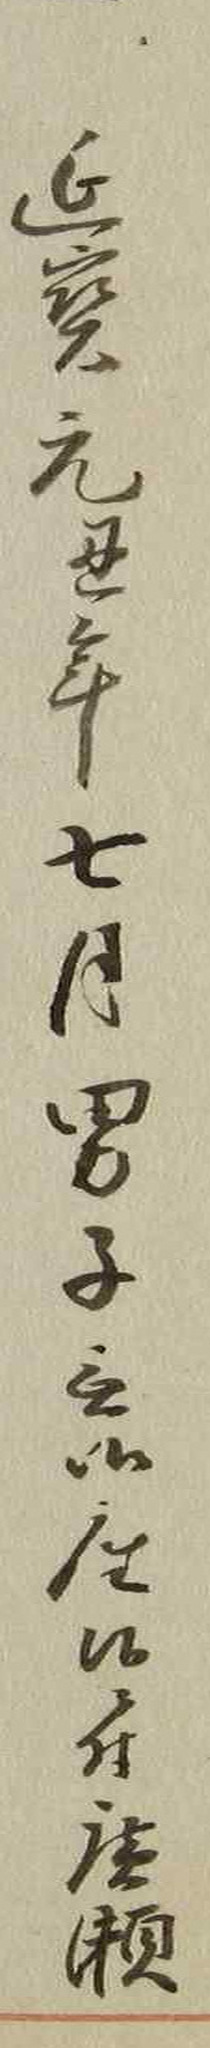一延宝元丑年七月男子無御座候ニ付広瀬
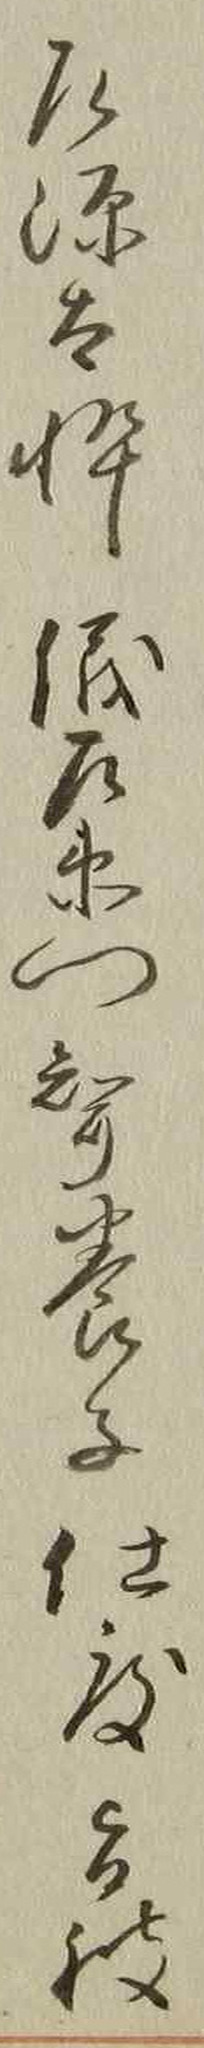左源太忰儀左衛門婿養子仕度旨被
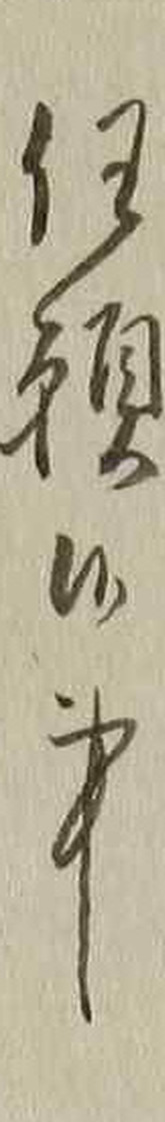任願候事
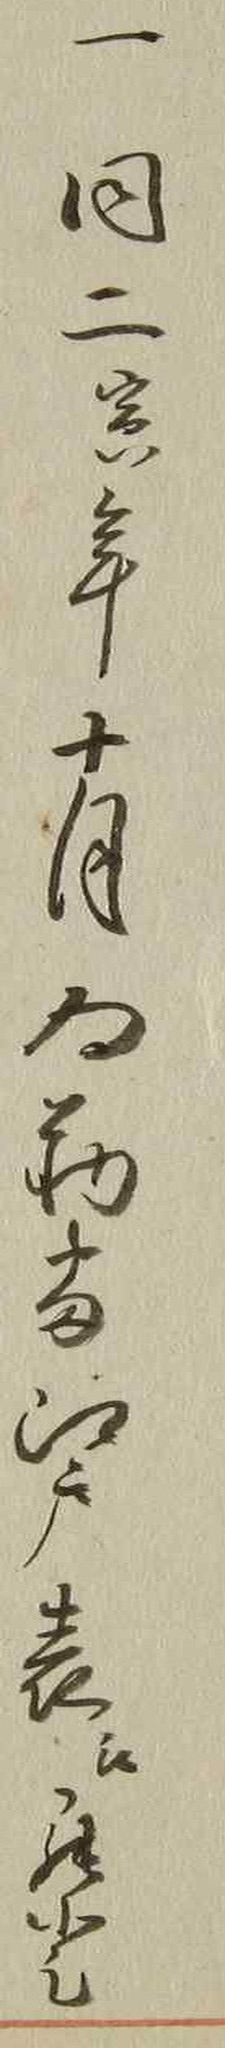一同二寅年十月為勤番江戸表江罷登
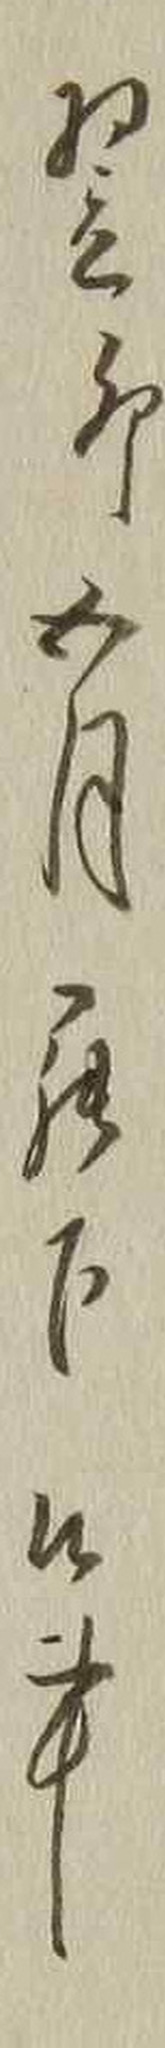翌卯五月罷下候事
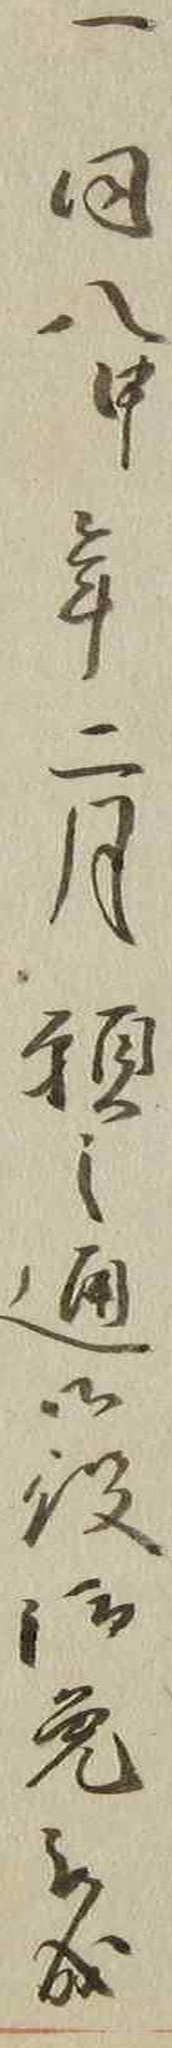一同八申年二月願之通御役御免被成
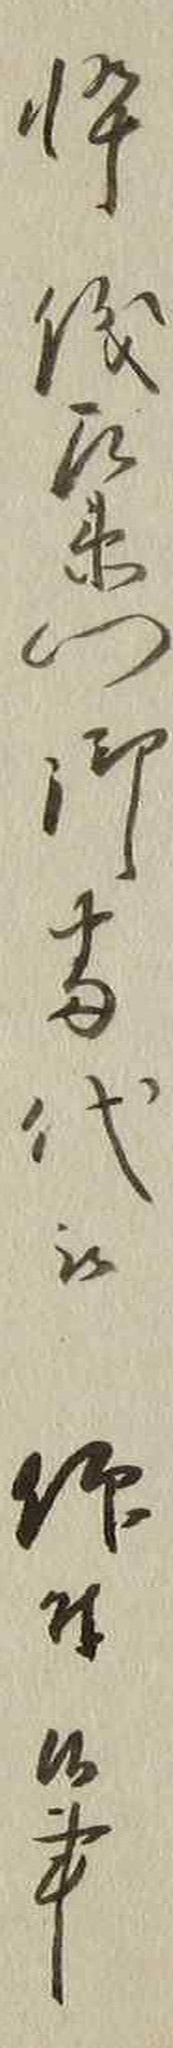忰儀左衛門御番代被仰付候事
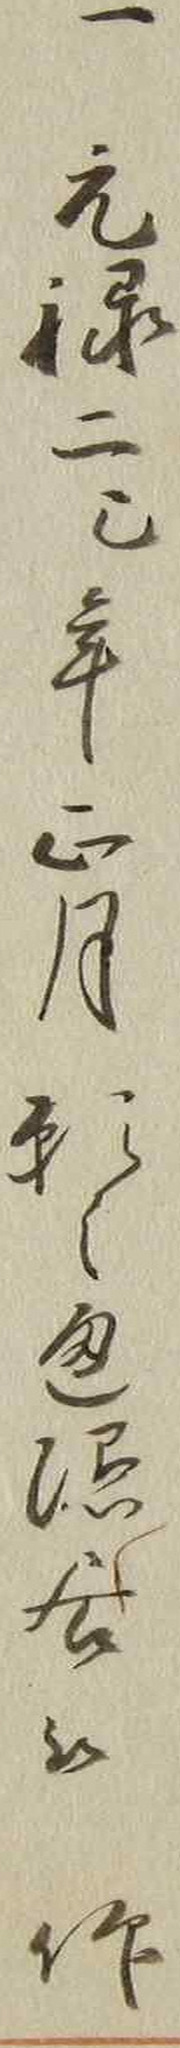一元禄二巳年正月願之通隠居被仰
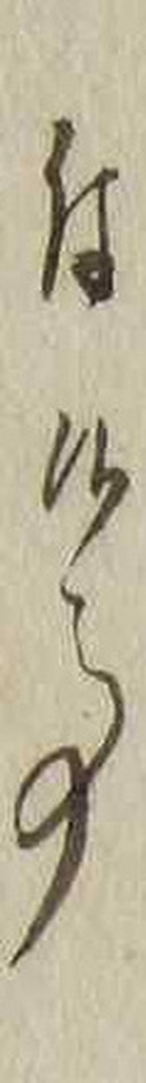付候事
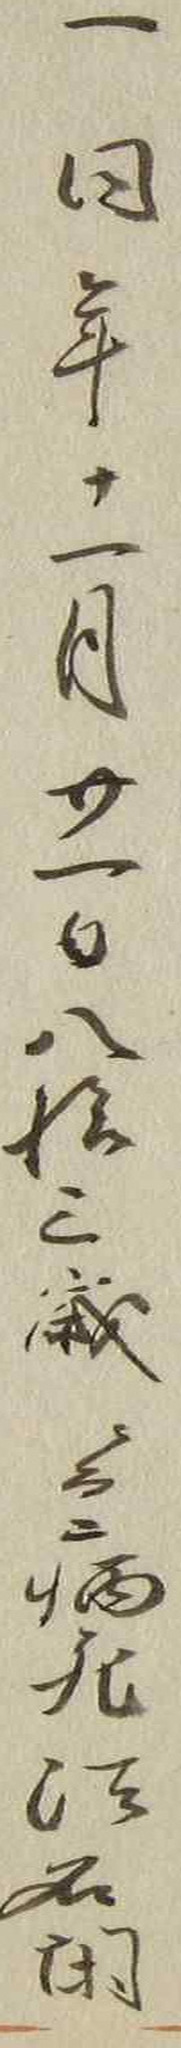一同年十一月廿一日八拾三歳ニ而病死法名閑
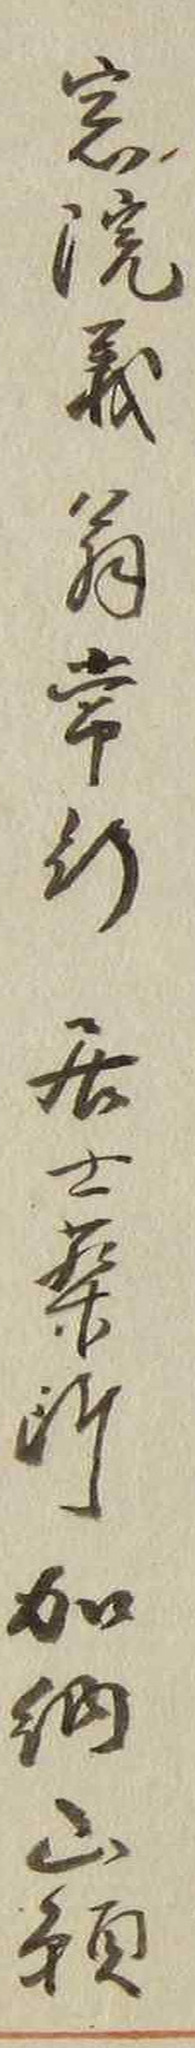窓院義翁常行居士葬所加納山願
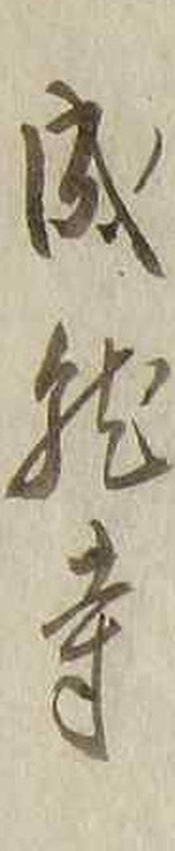成就寺

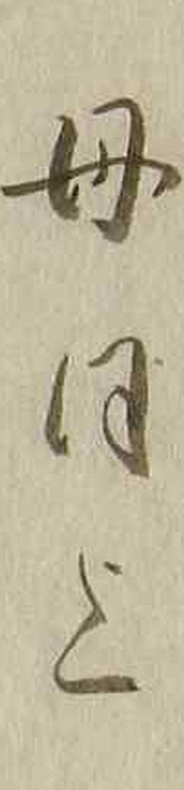母同上
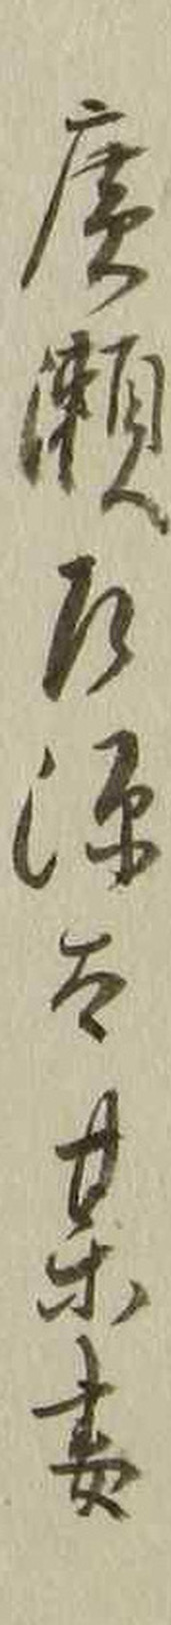女広瀬左源太某妻
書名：諸士系譜　巻之122　よ之部5
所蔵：会津若松市立会津図書館
